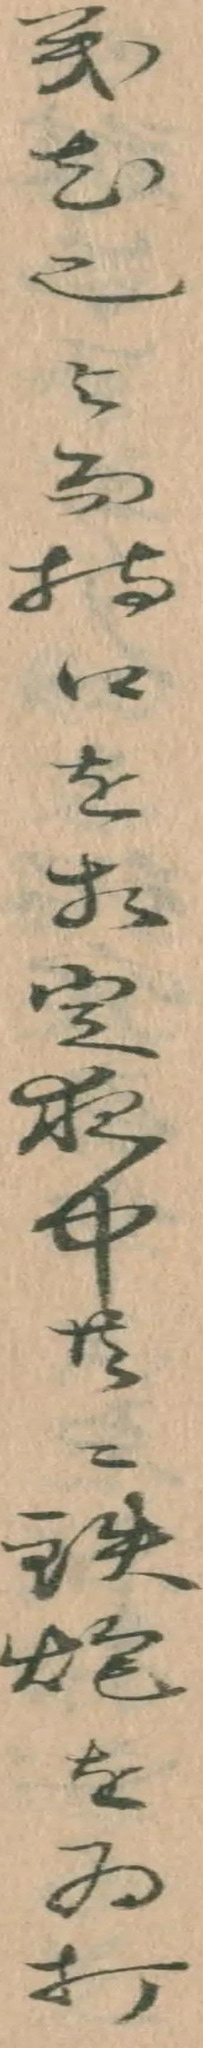義尤也与而持口を相定夜中共に鉄炮を為打
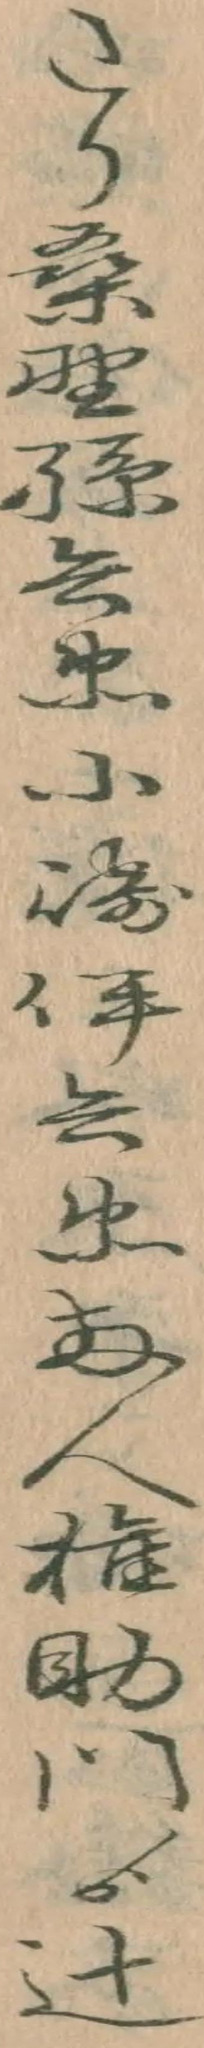たり桑野孫兵衛小崎伊兵衛両人権助川ゟ辻
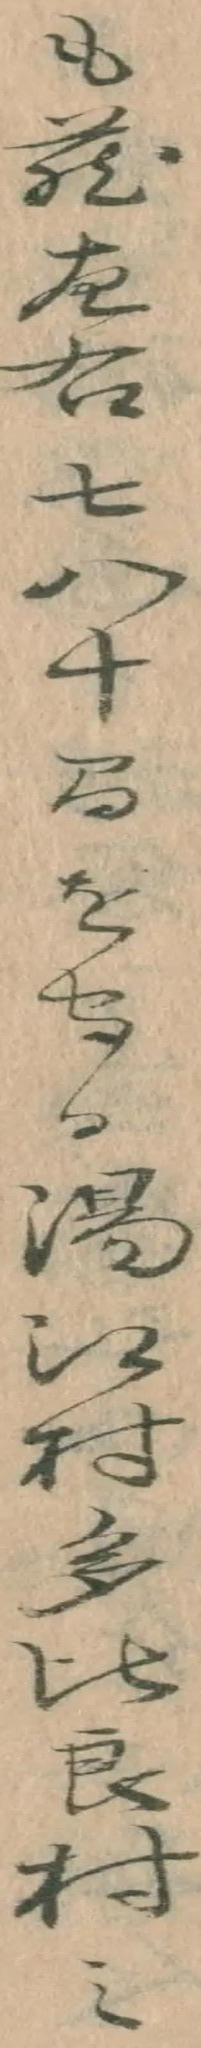も蔵左右七八十間を守る湯江村多比良村之
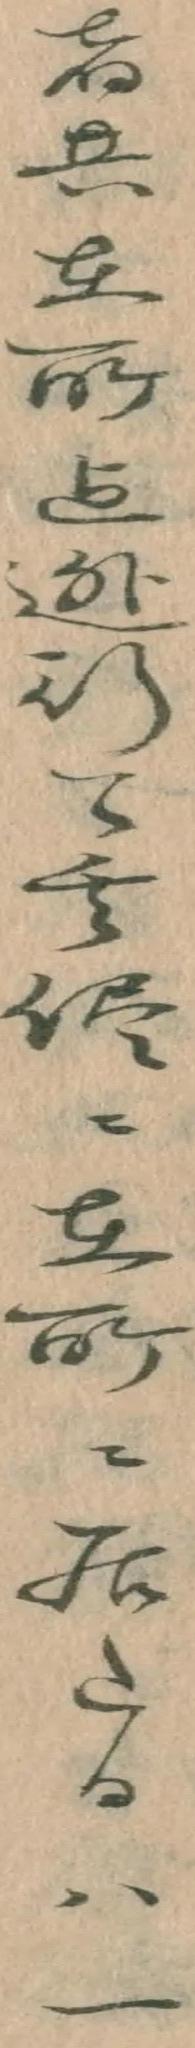者共在所迄逃行て其侭に在所に居たるは一
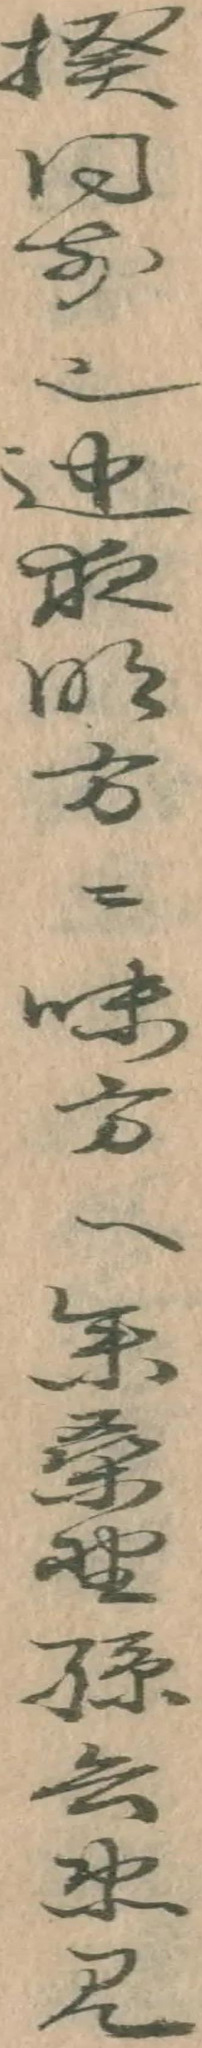揆同前也迚夜明方に味方へ参桑野孫兵衛見
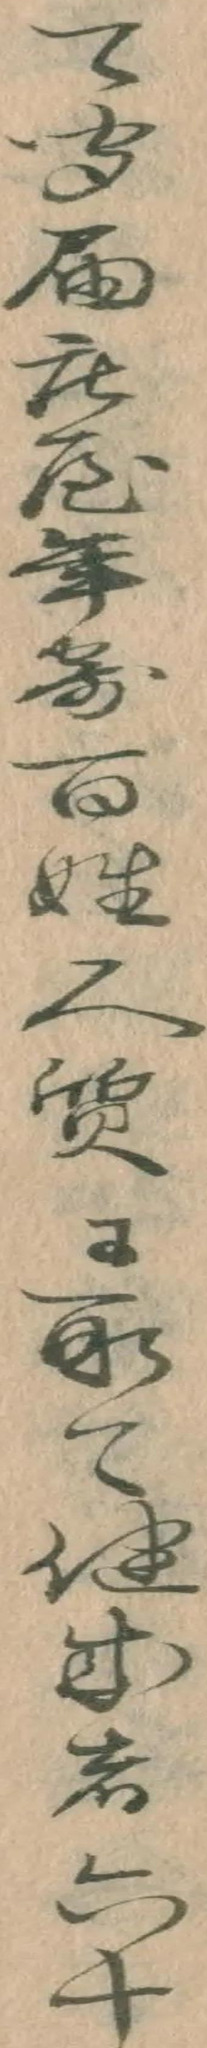て聞届庄屋年寄百姓人質に取て健成者六十
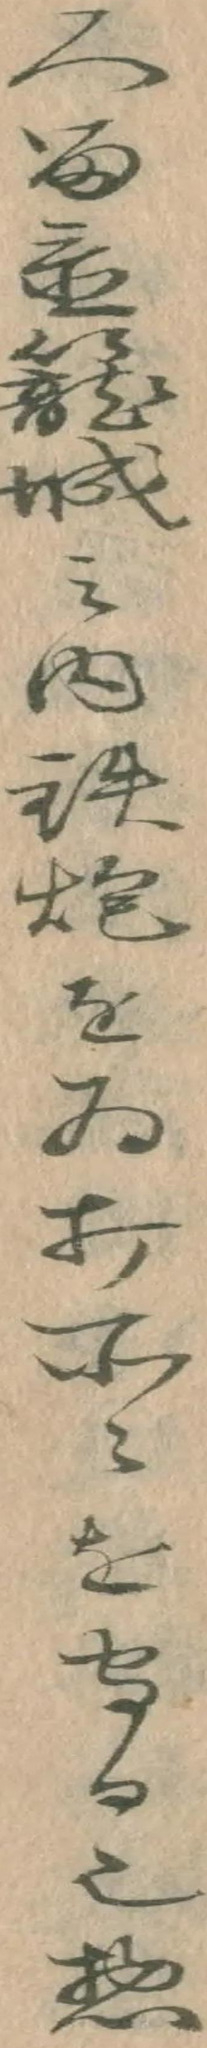人留置籠城之内鉄炮を為打所々を守る也惣
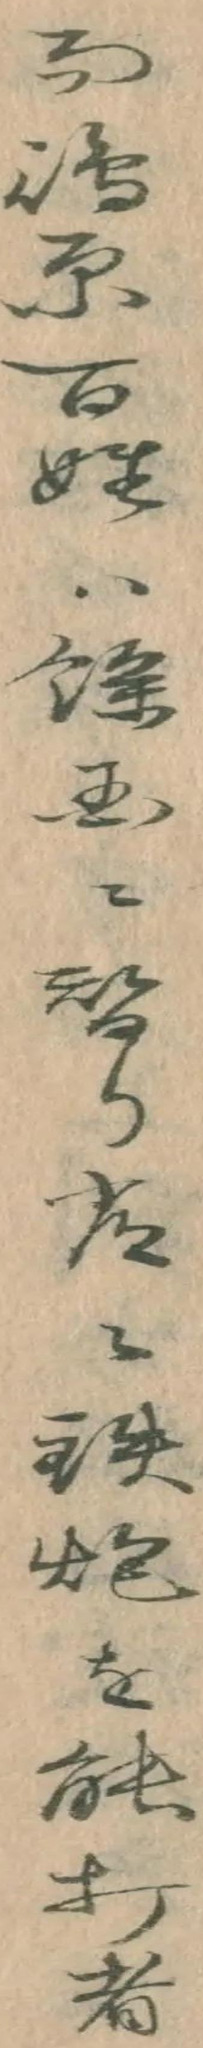而島原百姓は余国に替り常々鉄炮を能打者
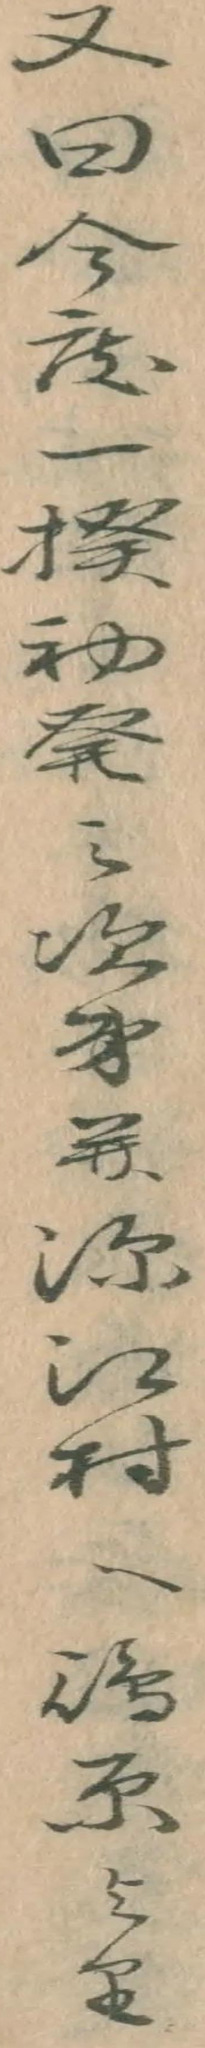又日今度一揆初発之次第深江村へ島原より

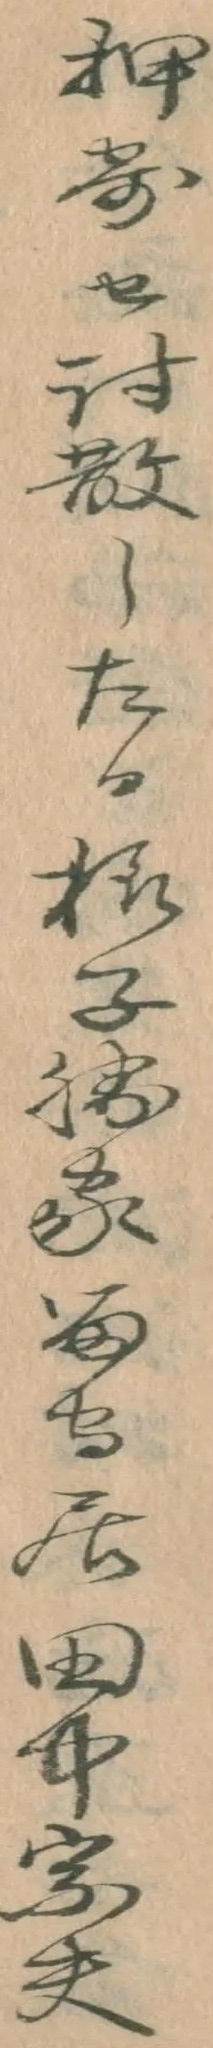押寄せ討散したる様子勝家留守居田中宗夫
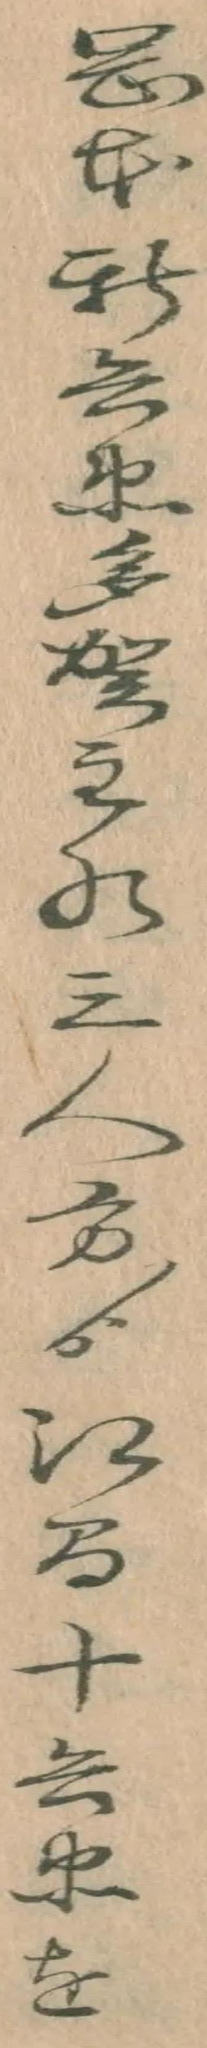岡本新兵衛多賀主水三人方ゟ江間十兵衛を
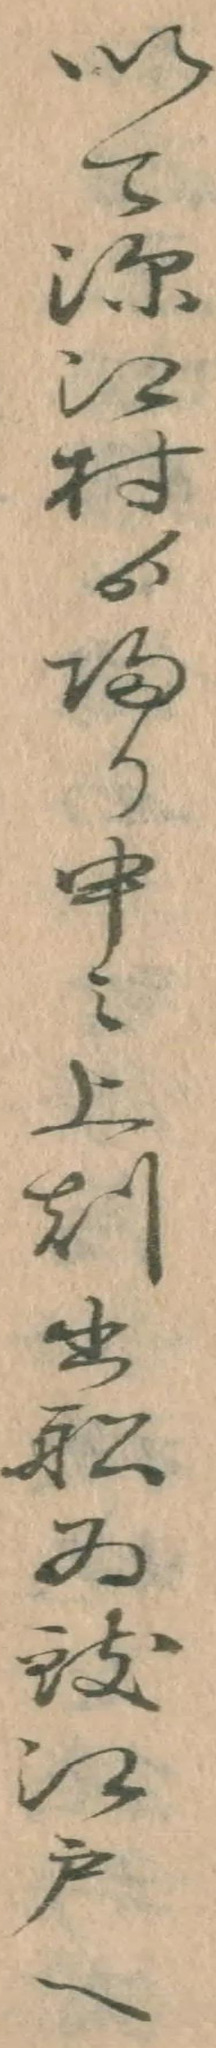以て深江村ゟ帰り申之上刻出船為致江戸へ
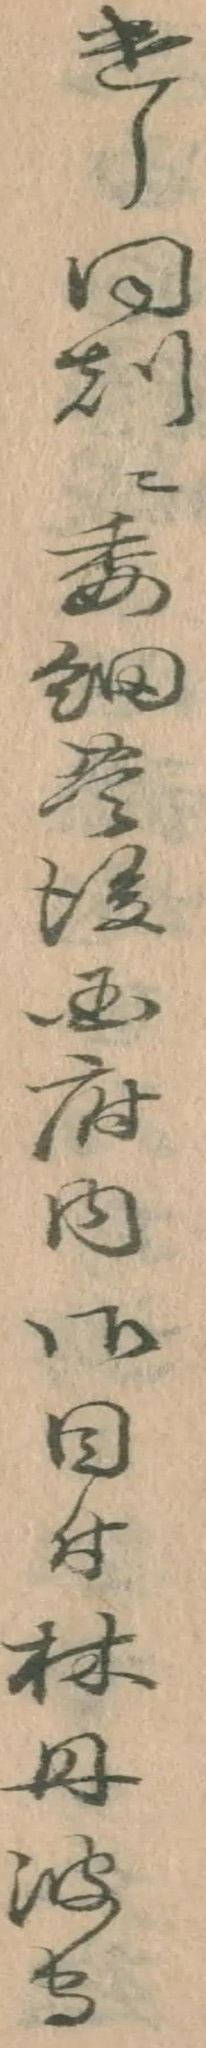遣し同刻に委細豊後国府内御目付林丹波守
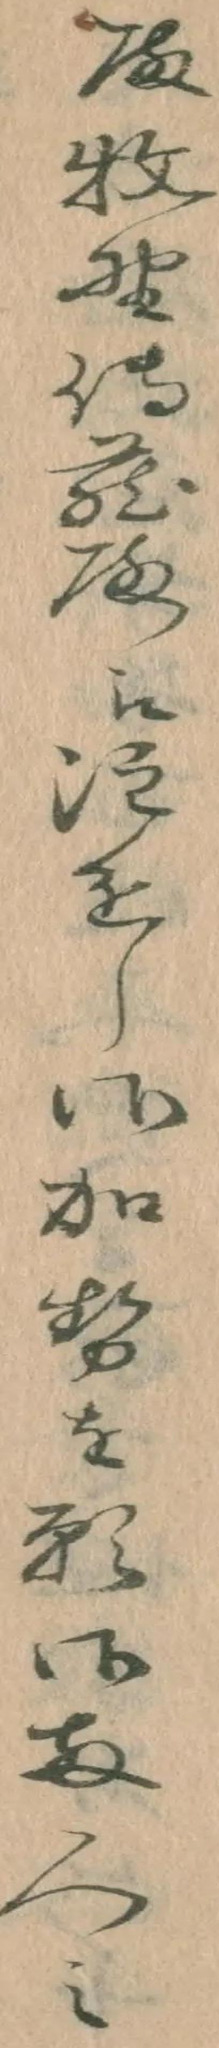殿牧野伝蔵殿え注進し御加勢を願御両人之
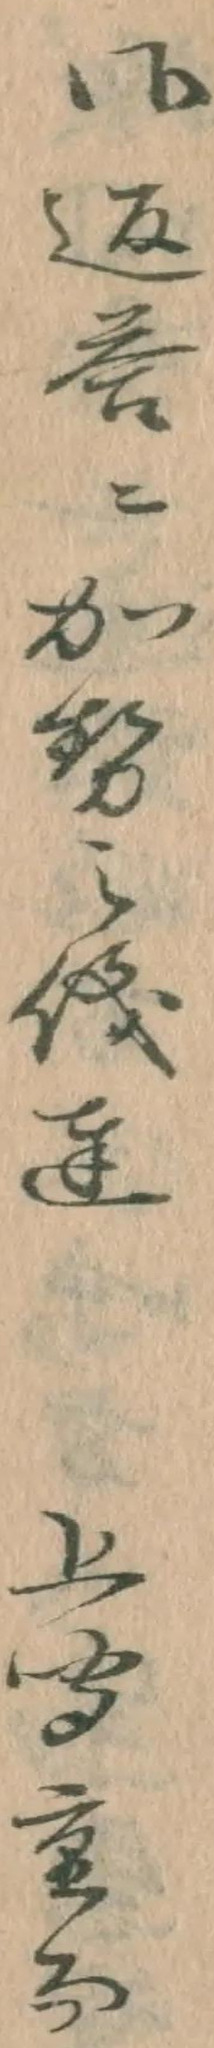御返答に加勢之儀達上聞重而上意
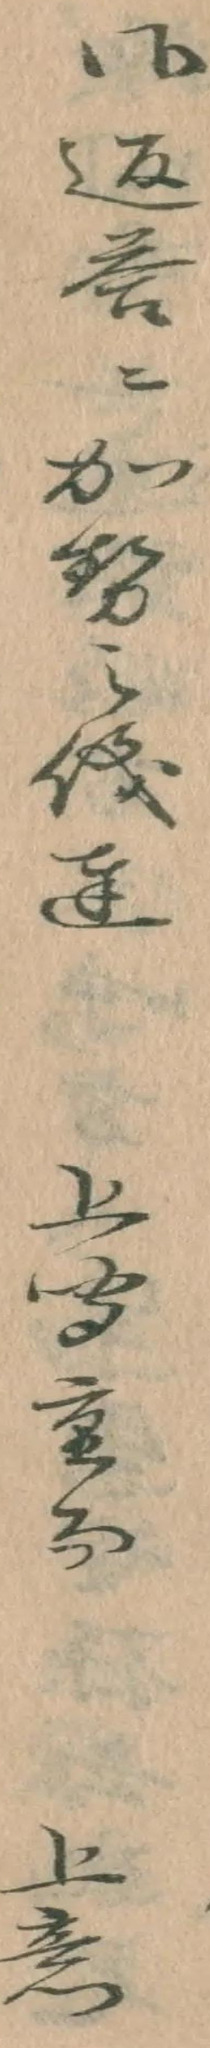御返答に加勢之儀達上聞重而上意
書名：切支丹御退治記 49巻. [1]
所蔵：国立国会図書館 National Diet Library, JAPAN
